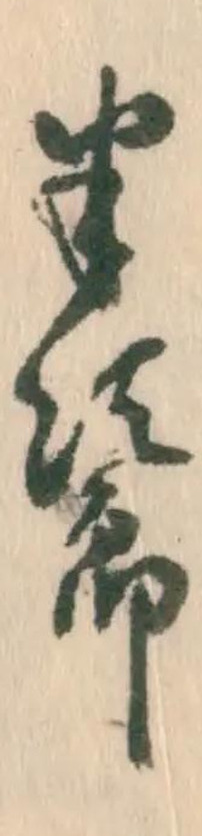半次郎
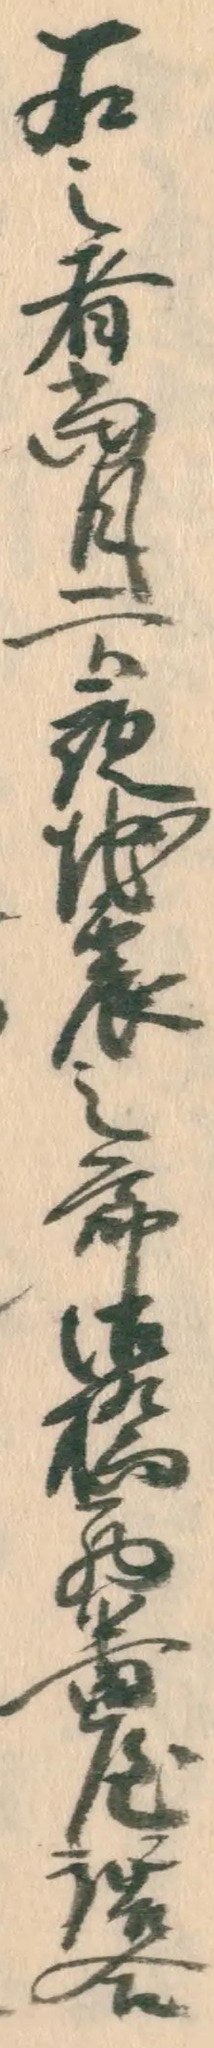右之者当月二日夜地震之節御橋西番屋ニ詰合
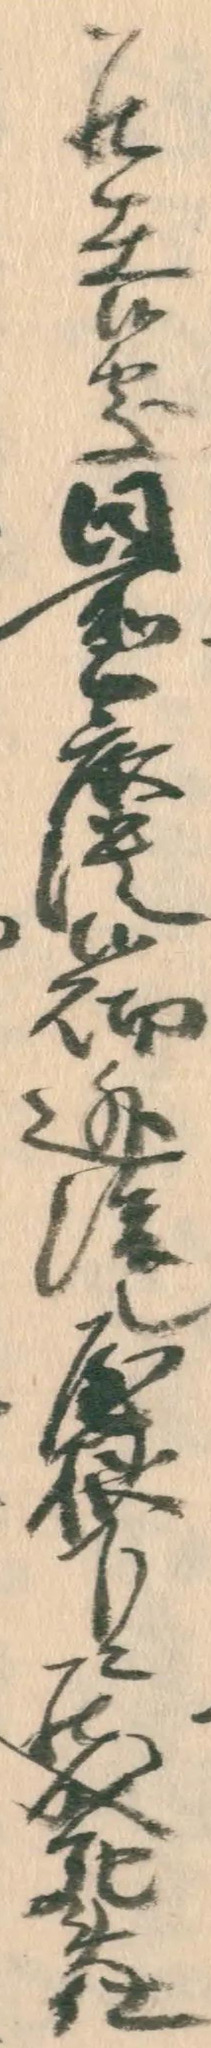罷在候処同所震潰候砌逃後レ屋根下ニ罷成死失仕
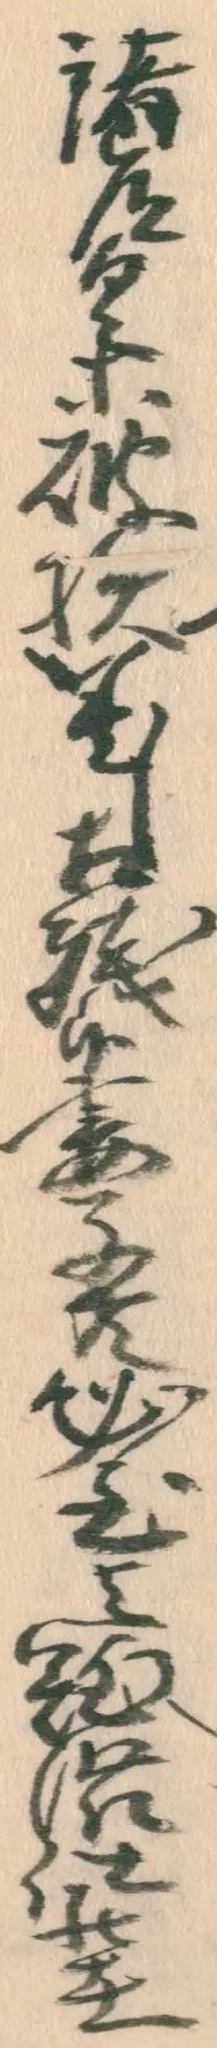諸道具等破損いたし相残候妻子共必至と難渋仕罷在
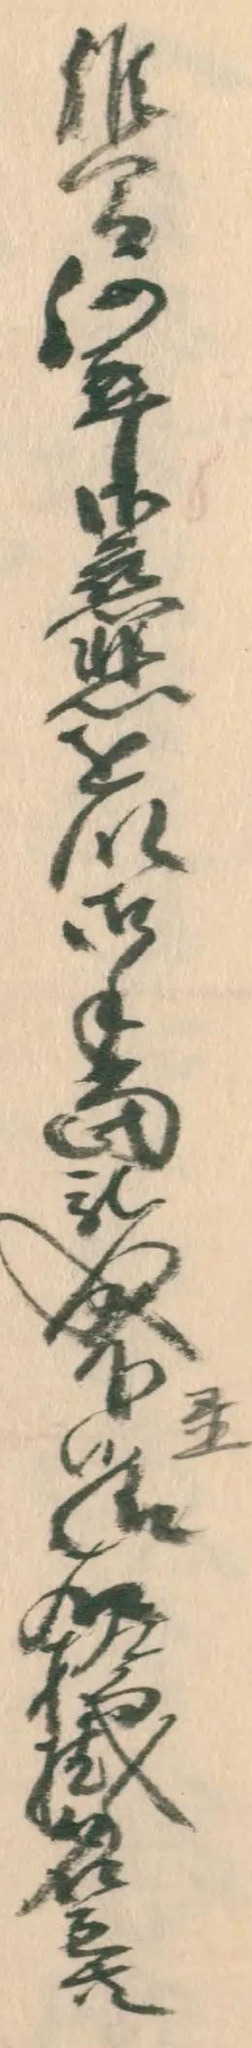候間何卒御慈悲を以御手当被成下置候様御橋掛り名主共
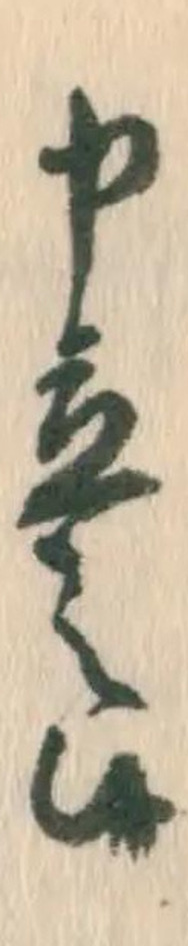申立之候

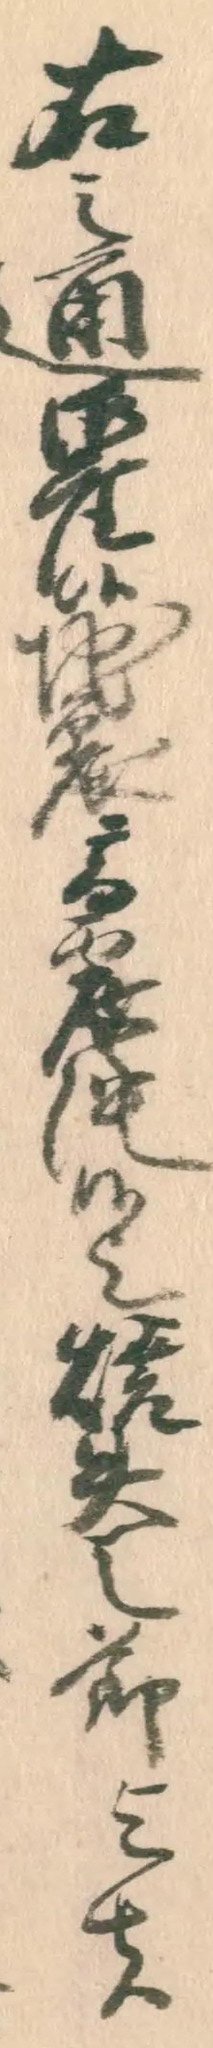右之通御座候地震ニ而震潰候と焼失之節とは
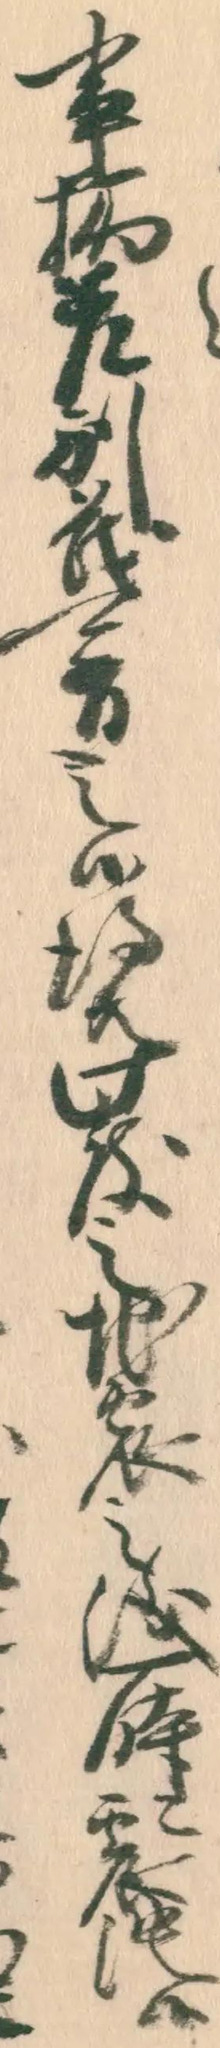事柄差別も可有之候へ共此度之地震之儀一時ニ震潰候
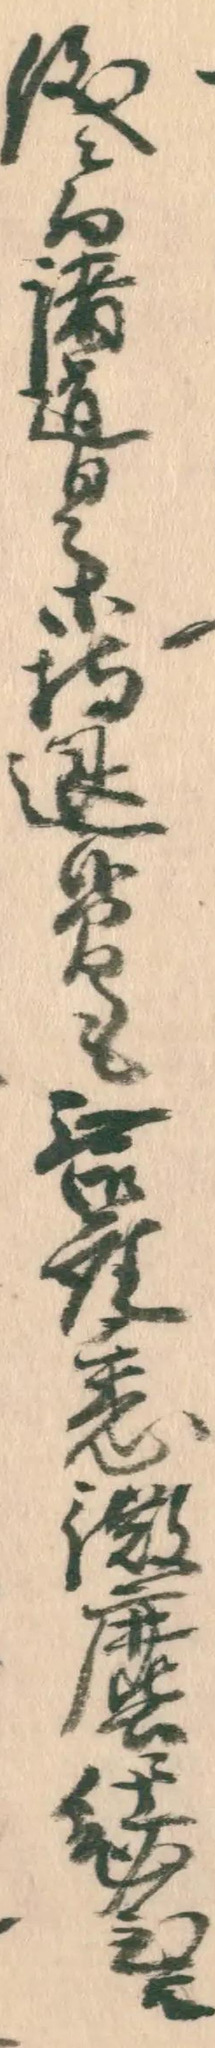儀ニ而諸道具等持退候間も無御座悉微塵ニ仕必至と
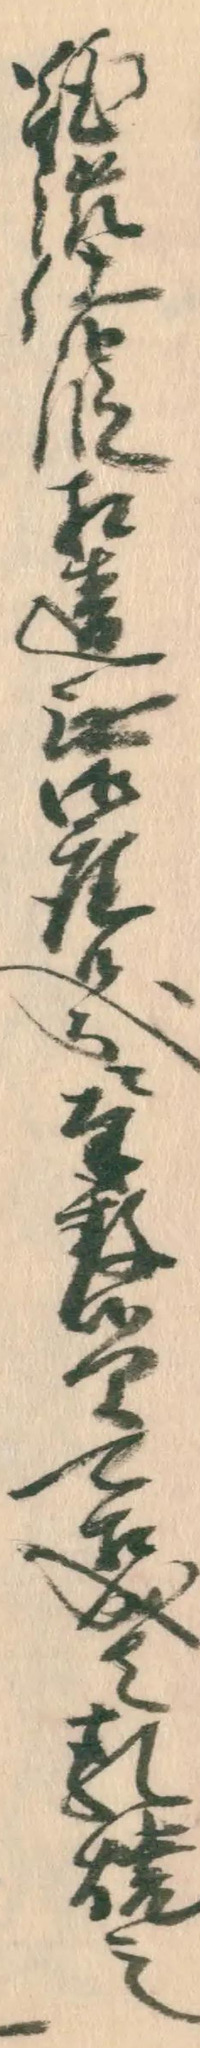難渋仕候段相違無御座候哉ニ奉存候間可相成は類焼之
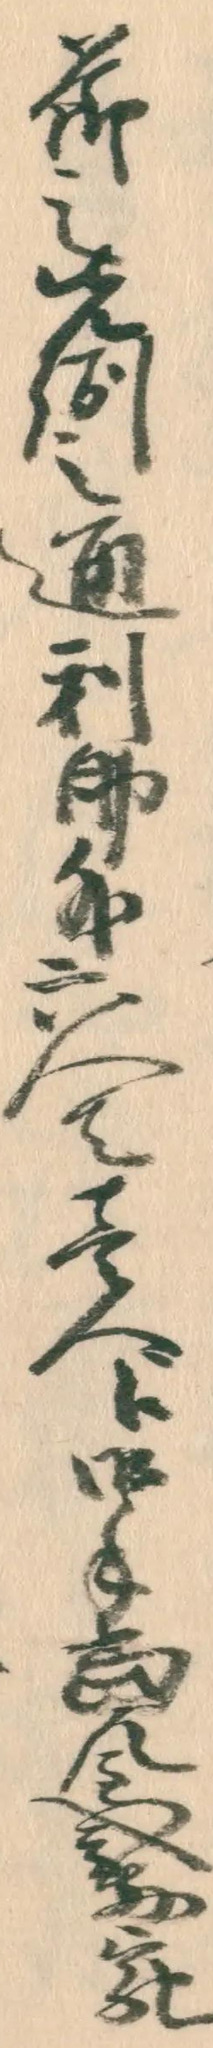節之先例之通利助外六人は壱人え御手当金弐両宛
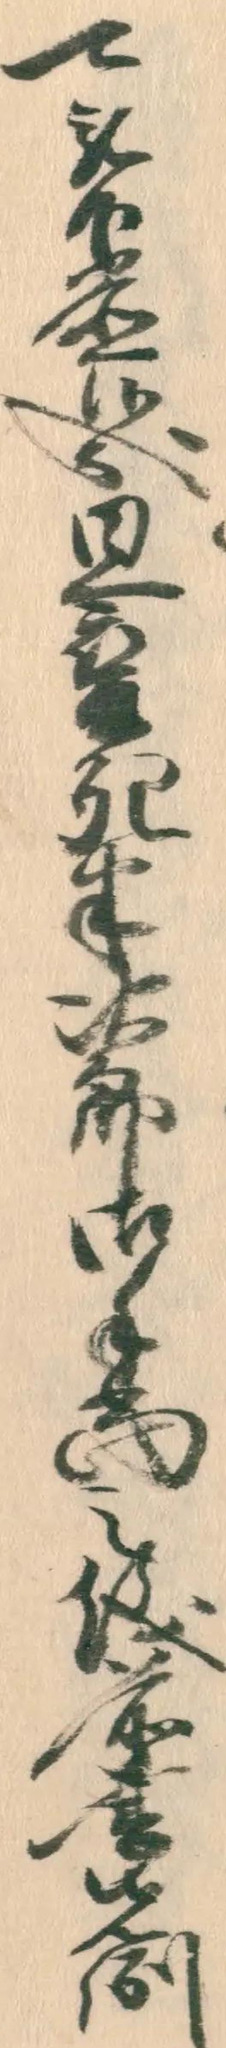可被下置候哉且変死半次郎御手当之儀前書先例
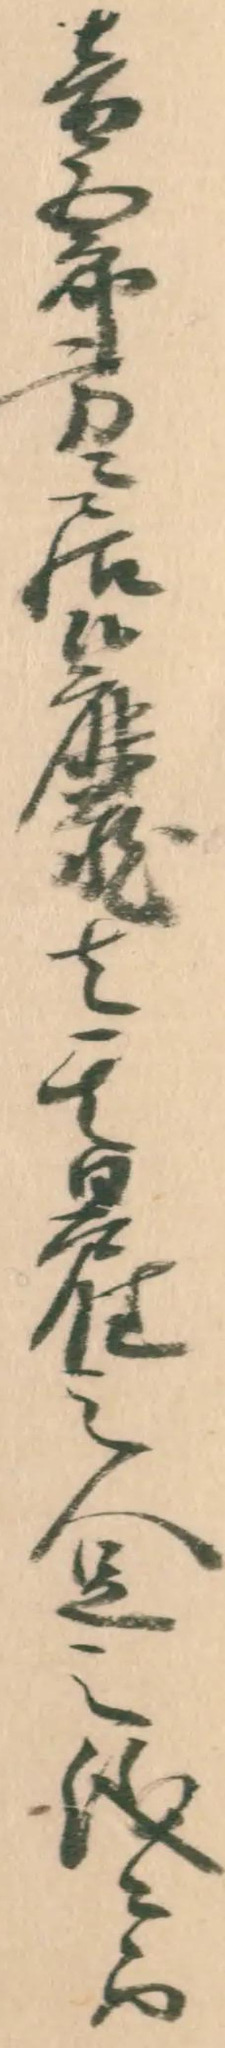音五郎方ニ居候鹿蔵は其日雇之人足之儀ニ候而
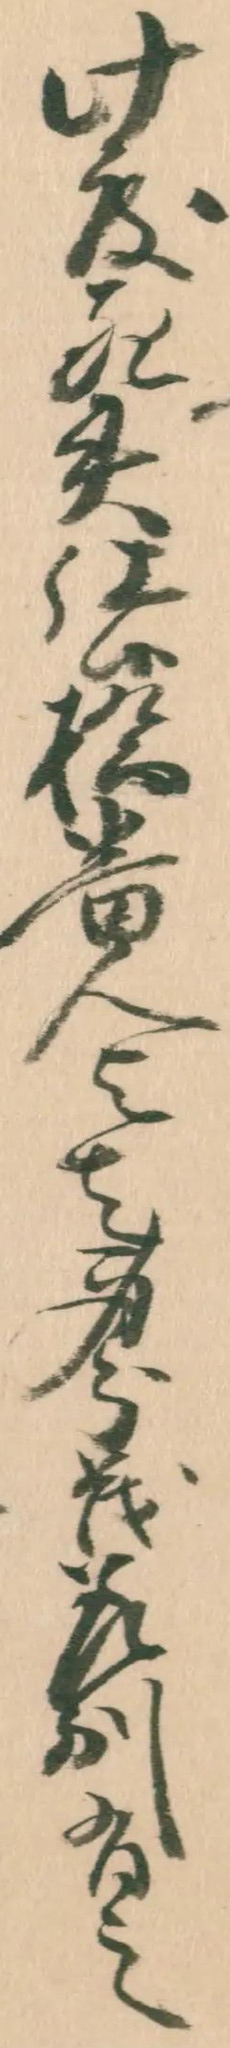此度死失仕候橋番人とは身分も差別有之
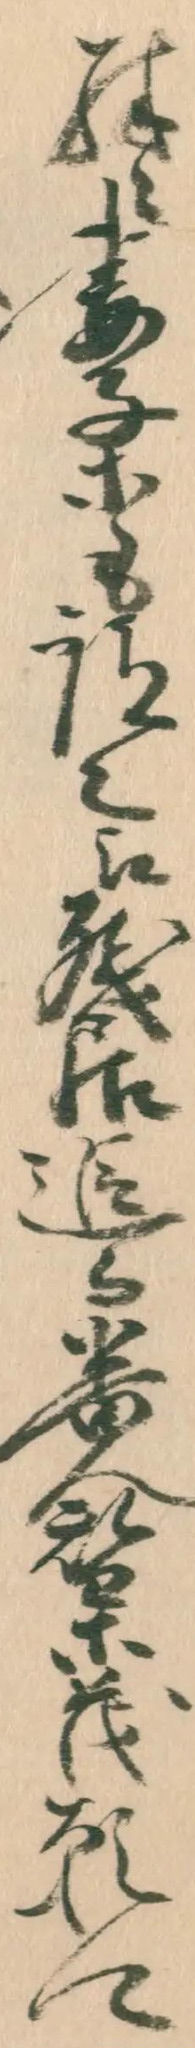殊ニ妻子等も跡々え残居追而番人替等も願上
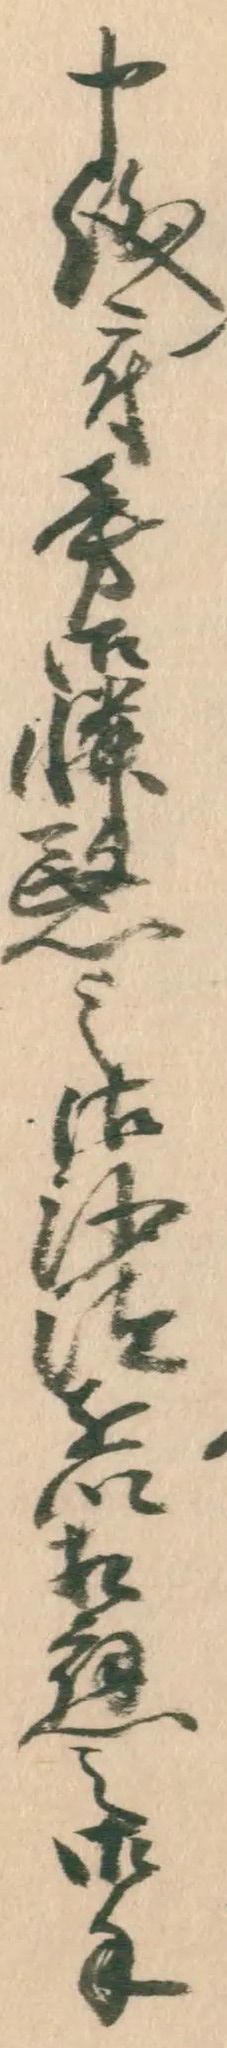申儀ニ付旁御憐愍之御沙汰を以相応之御手
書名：三橋 17巻. [8] 三橋小破御修復書留　但御奉行御掛リ替地震潰橋番屋　嘉永四亥年より安政二卯年迄　下
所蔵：国立国会図書館 National Diet Library, JAPAN
